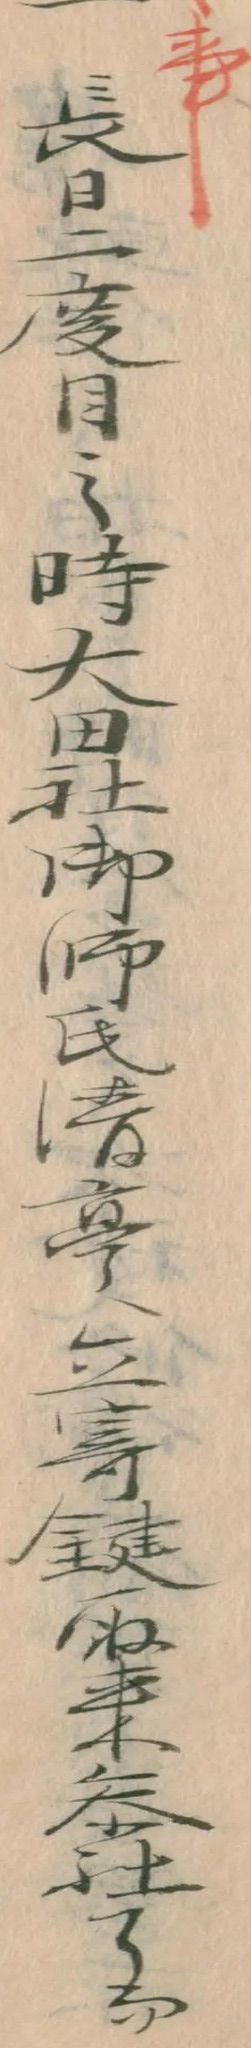一長日二度目之時大田社御師氏清亭へ立寄取来参社了而

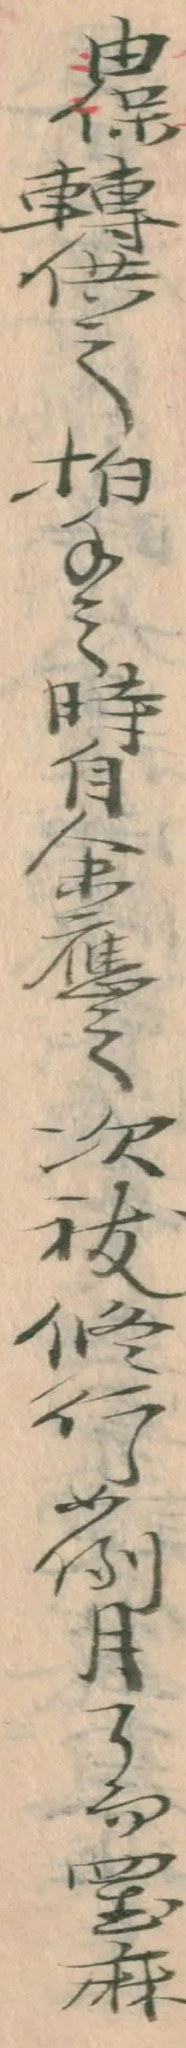由保轉供之拍手之時自余應之次祓修行如例月了而置麻
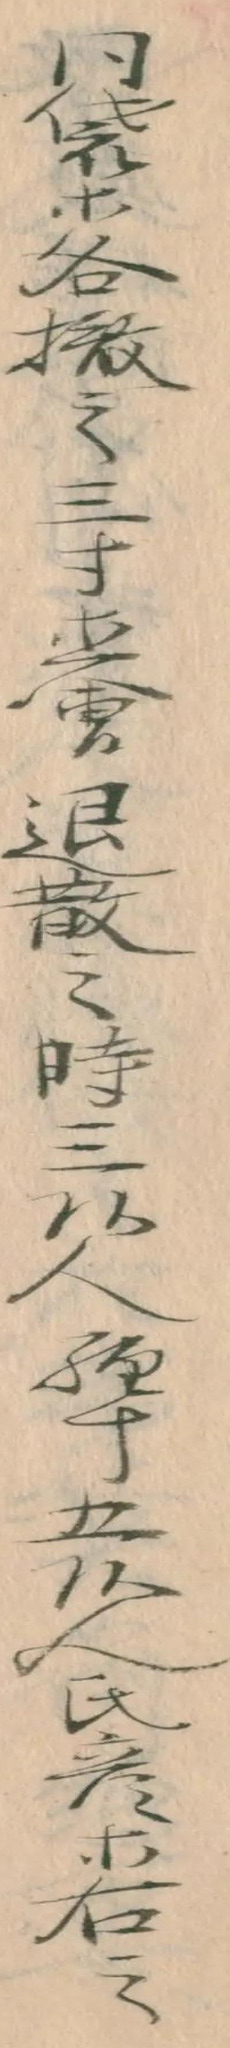同袋等各撒之三寸直會退散之時三頭人経千五頭人氏彦等右之
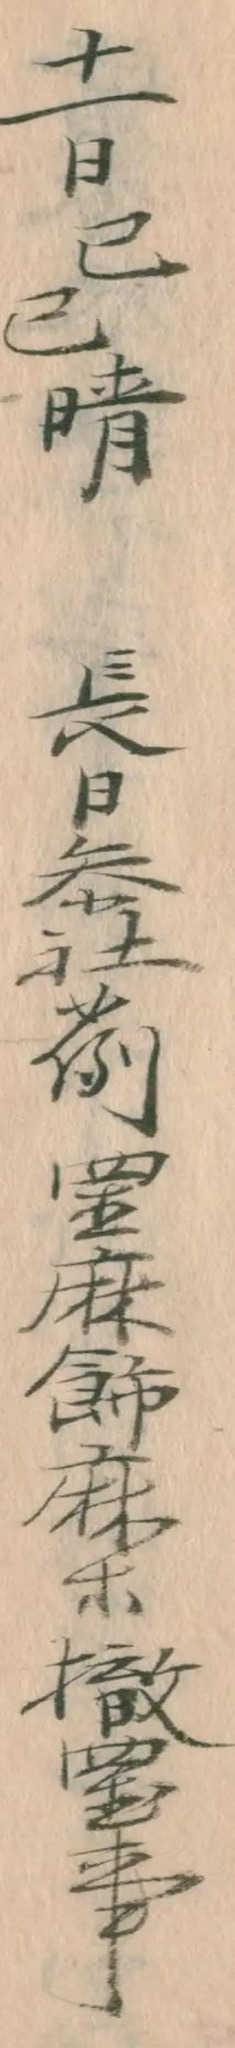十一日己巳晴長日参社如例置麻飾麻等撤置事
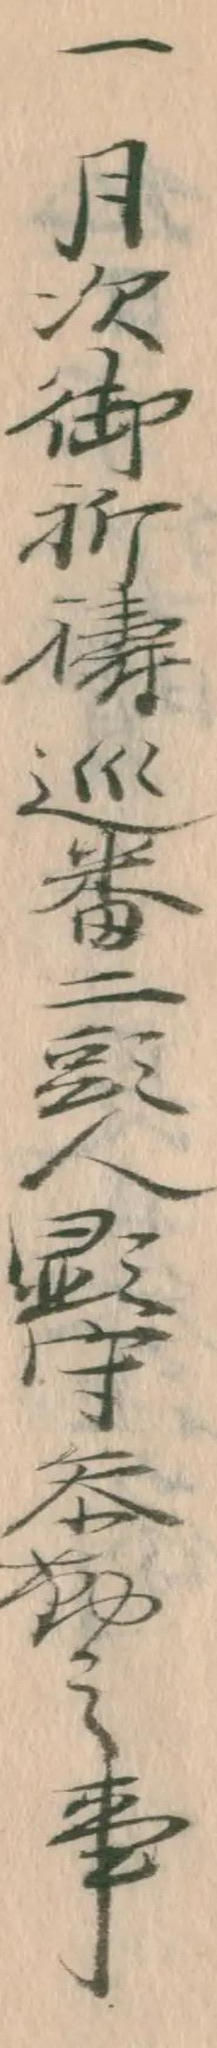一月次御祈祷巡番二頭人顕守参勤之事
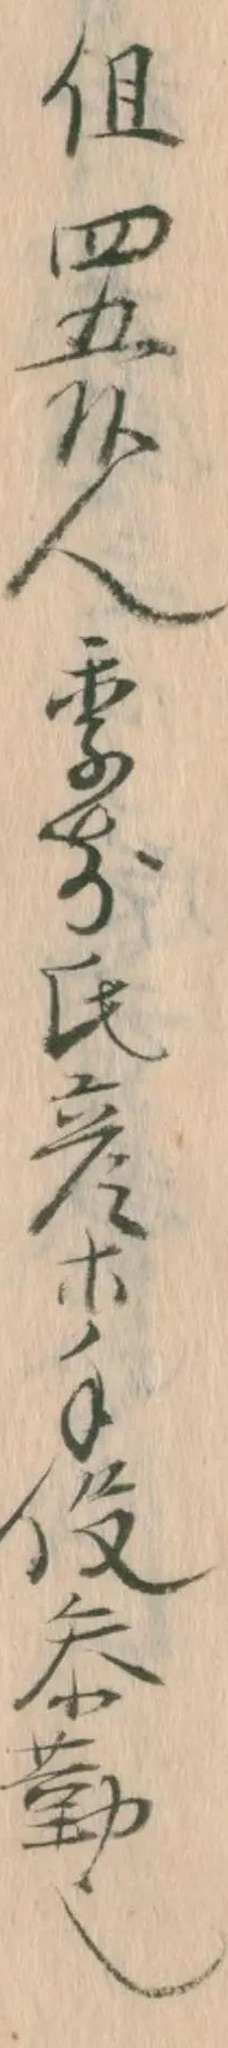但四五頭人季前氏彦等手役参勤也
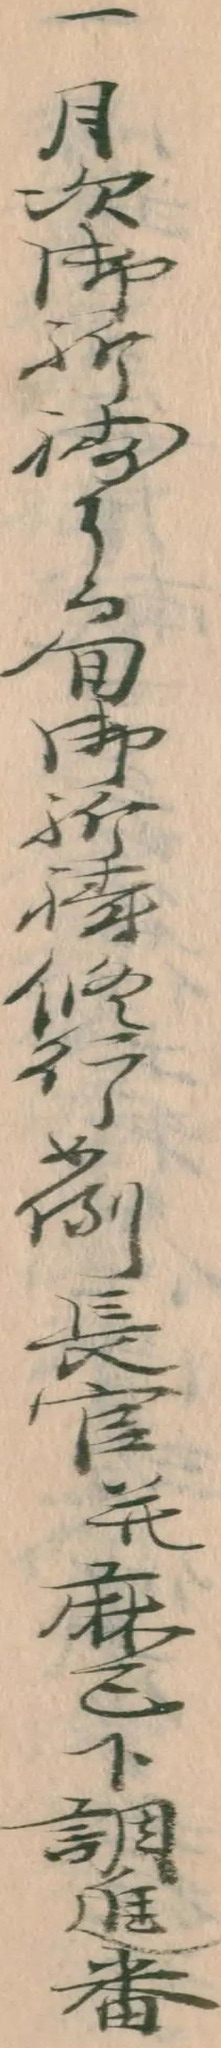一月次御祈祷了而旬御祈禱修行如例長官并麻巳下調進番
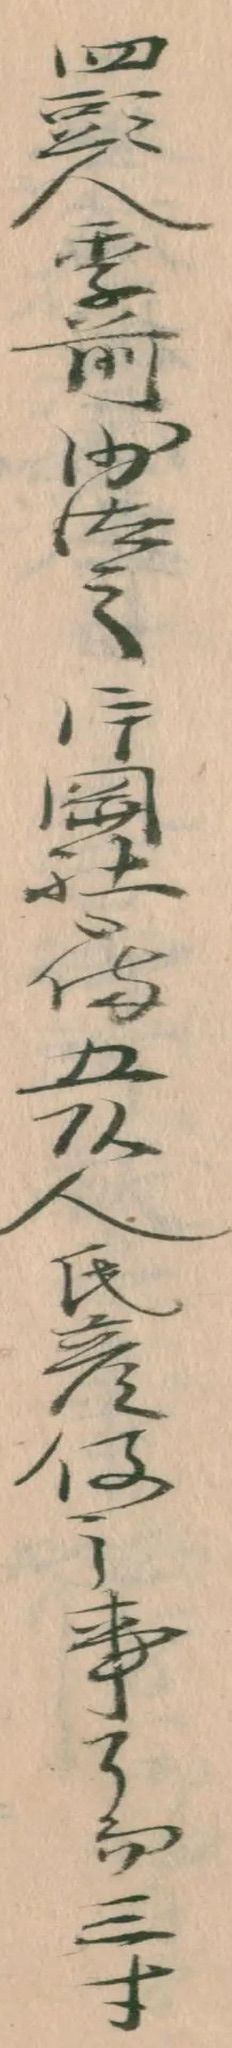四頭人季前沙汰之片岡社御備五頭人氏彦役之事了而三寸
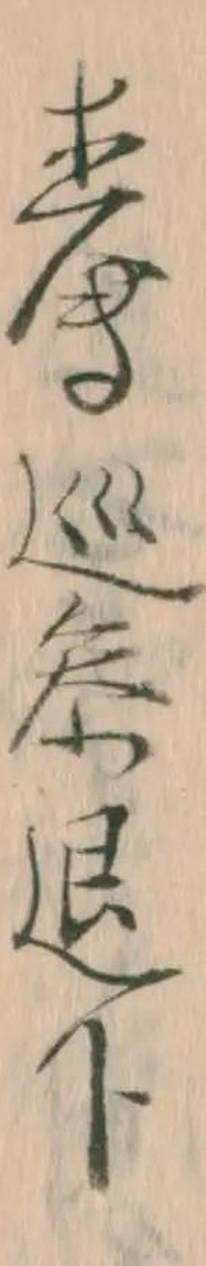直會巡参退下
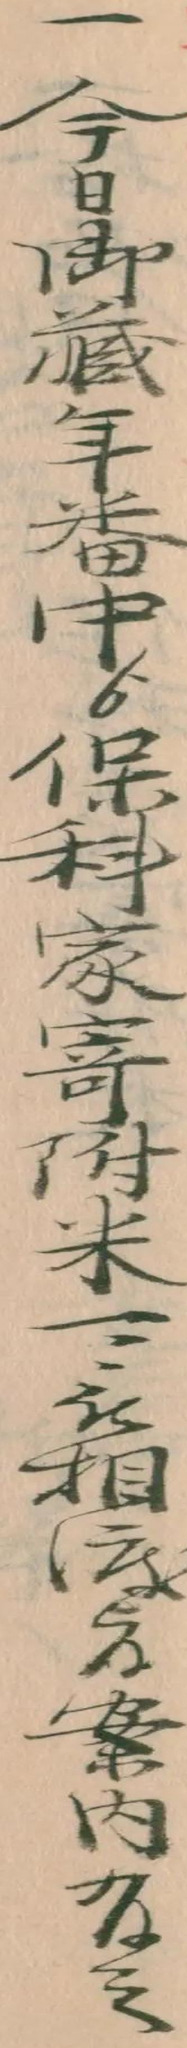一今日御蔵年番中ゟ保科家寄附米可被相渡旨案内有之
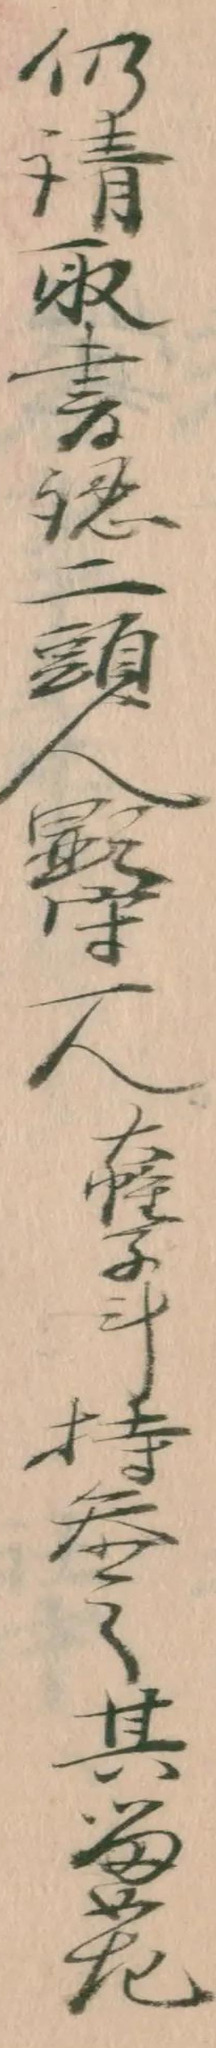仍請取書認二頭人顕守一人大帷子斗持参之其留如左
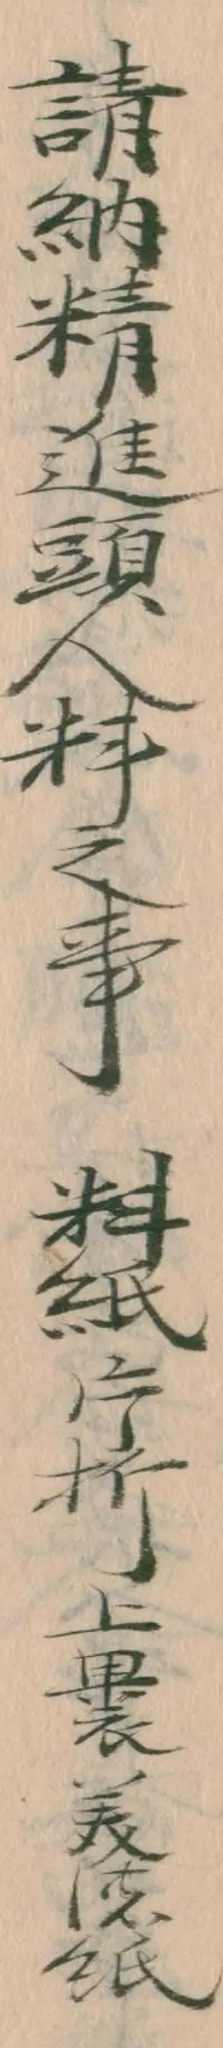請納精進頭人料之事料紙片折上褁美濃紙
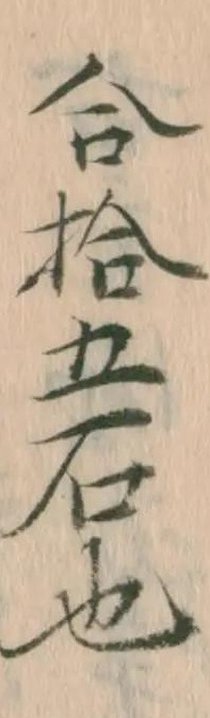合拾五石也
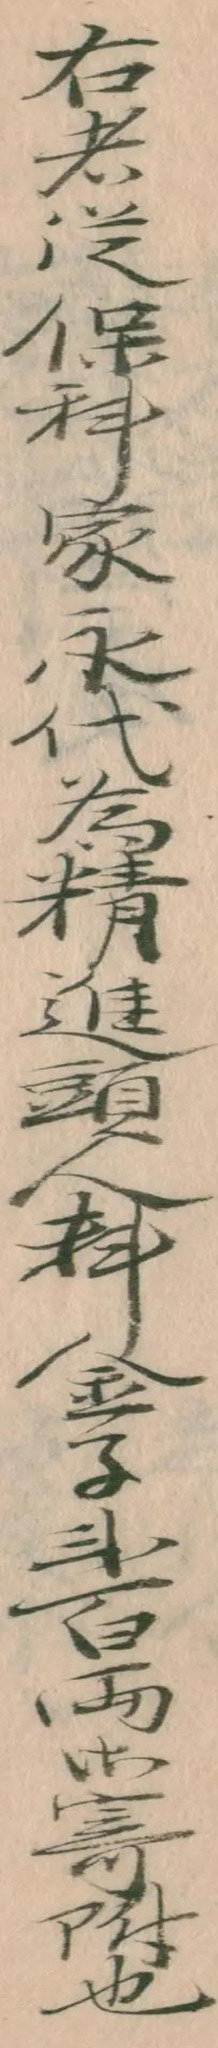右者従保科家永代為精進頭人科金子弐百両御寄附也
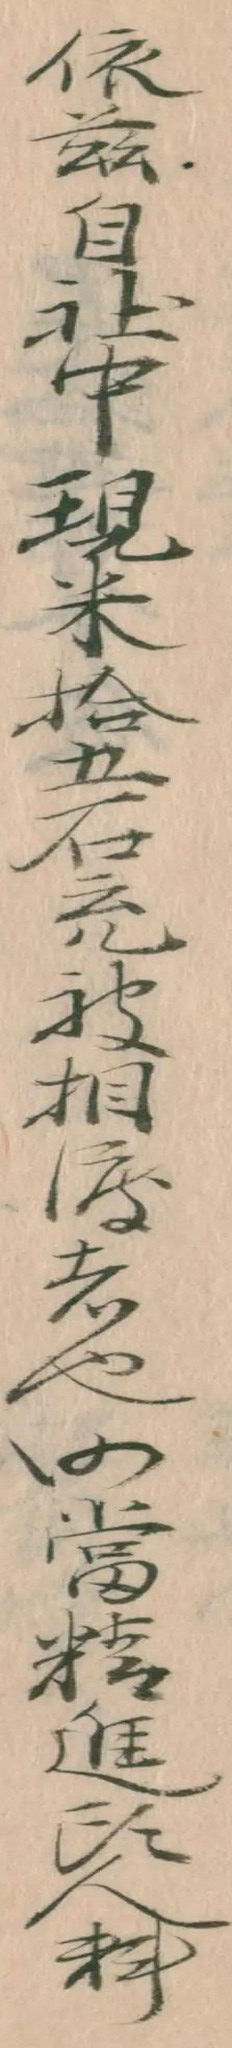依茲自社中現米拾五石充被相渡者也仍當精進頭人科
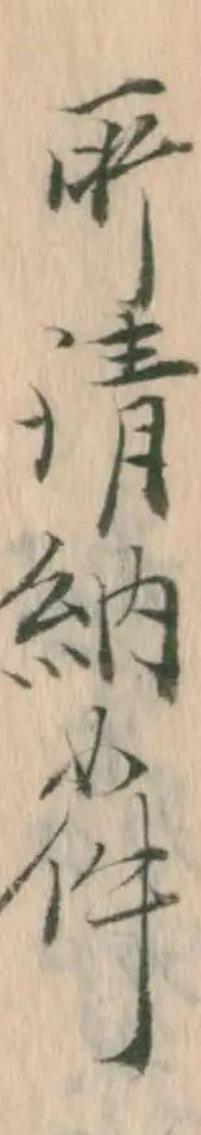所清納如件
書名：賀茂社記録. 第74冊
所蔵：国立国会図書館 National Diet Library, JAPAN
